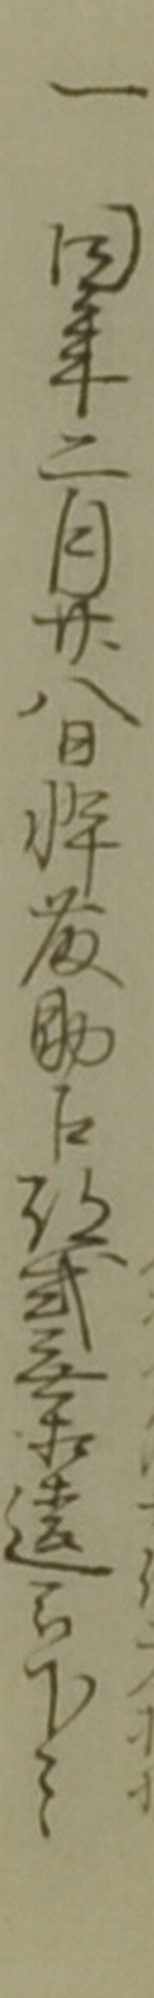一同年二月廿八日忰藤助江跡式無相違被下之
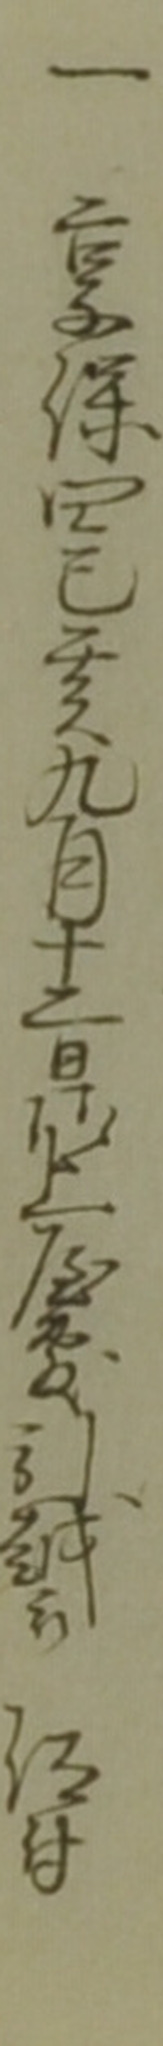一享保四己亥九月十二日御上屋敷引越被仰付
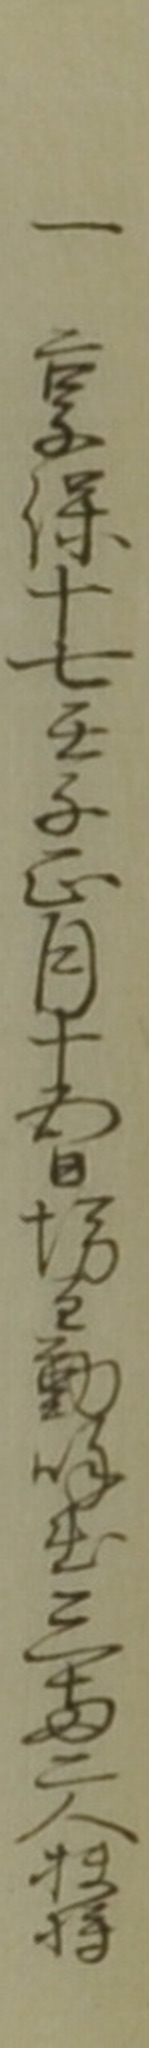一享保十七壬子正月十五日坊主勤呼出三両二人扶持
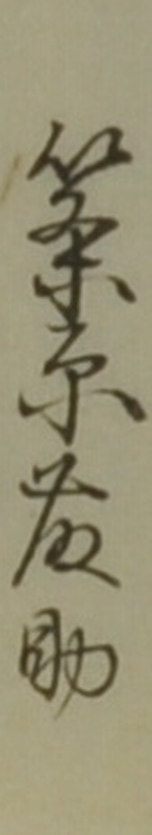篠原藤助
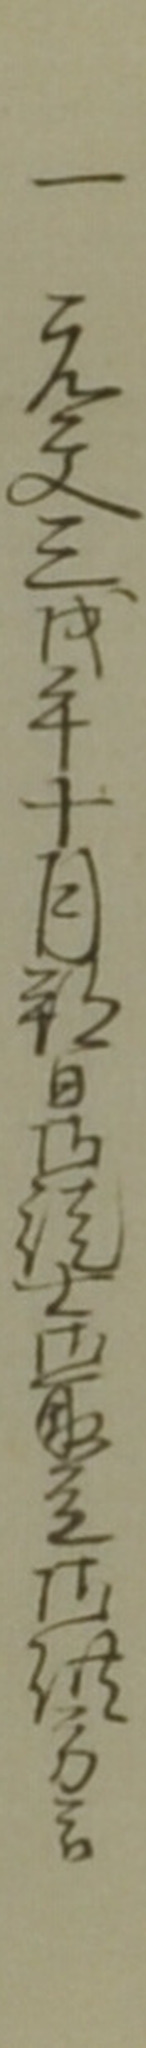一元文三戊午十月朔日御徒士御取立御供方被

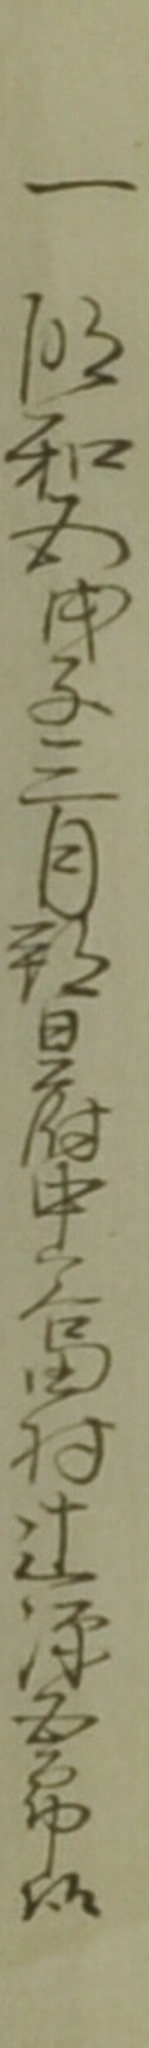一明和五戊子三月朔日府中谷田村辻源五郎様
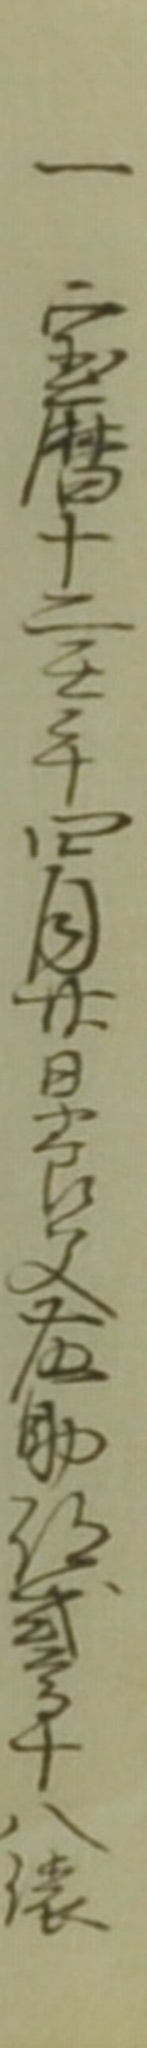一宝暦十二壬午四月廿日養父藤助跡式高十八俵
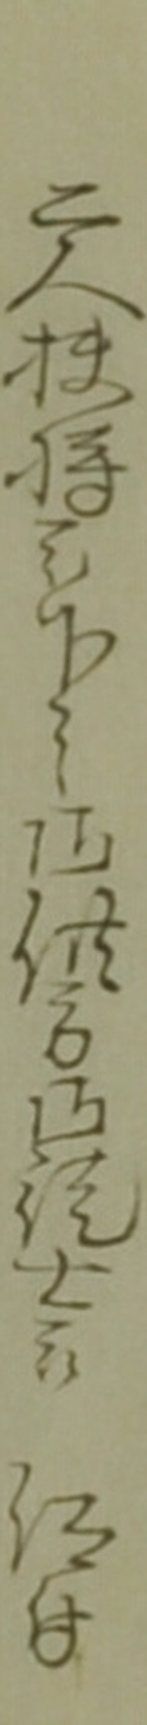二人扶持被下之御供方御徒士被仰付
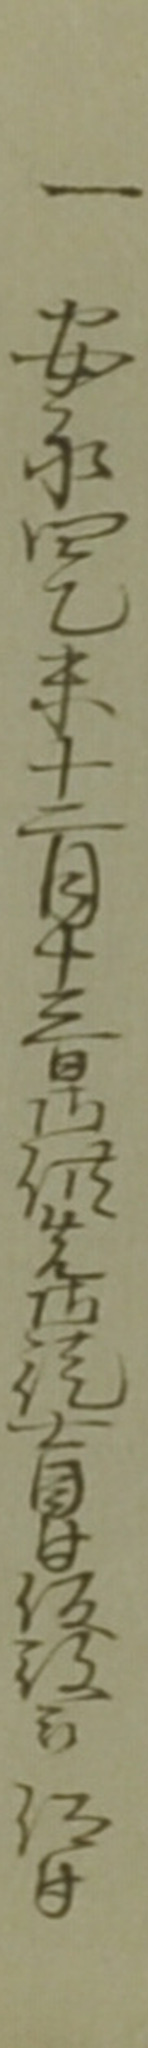一安永四乙未十二月十三日御供先御徒士目付仮役被仰付
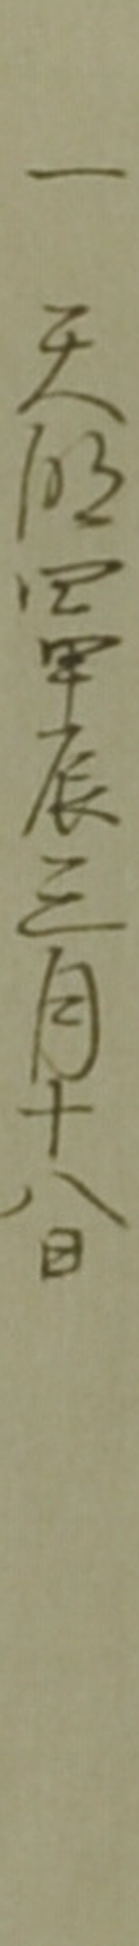一天明四甲辰三月十八日
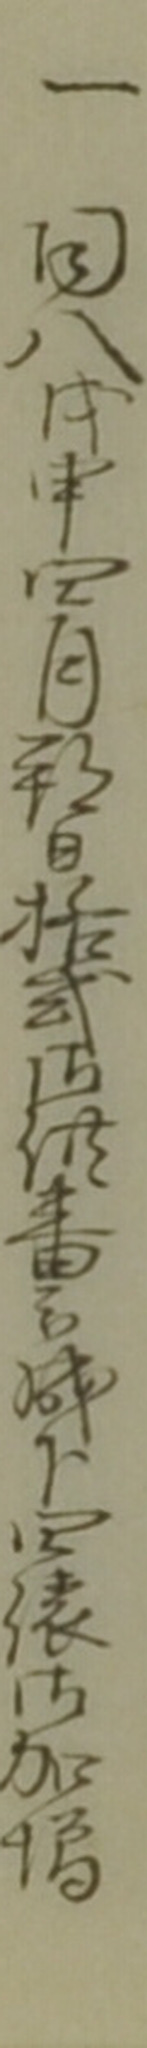一同八戊申四月朔日格式御供番被成下四俵御加増
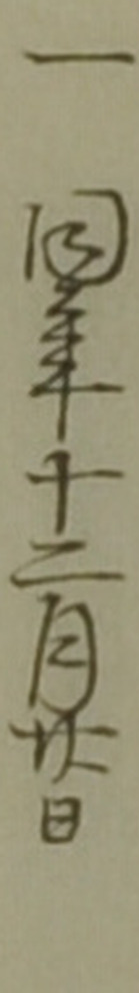一同年十二月廿日
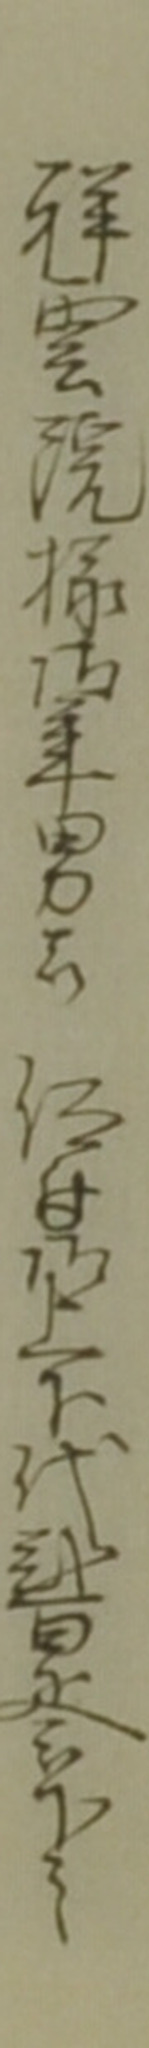祥雲院様御年男被仰付御上下代弐百疋被下之
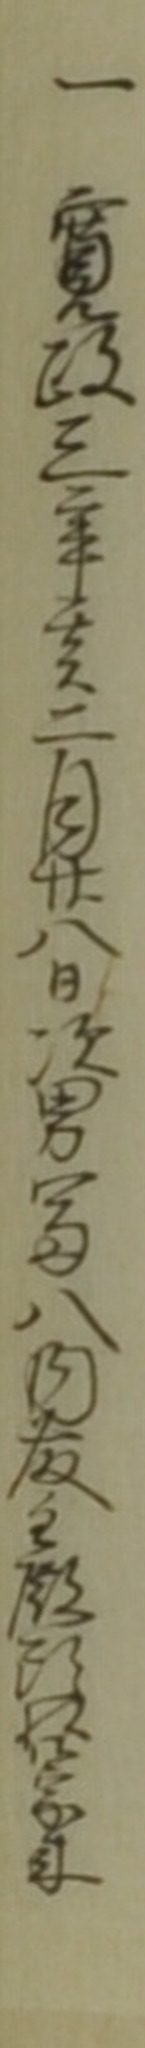一寛政三辛亥二月廿八日次男冨八内藤主殿頭様御家来
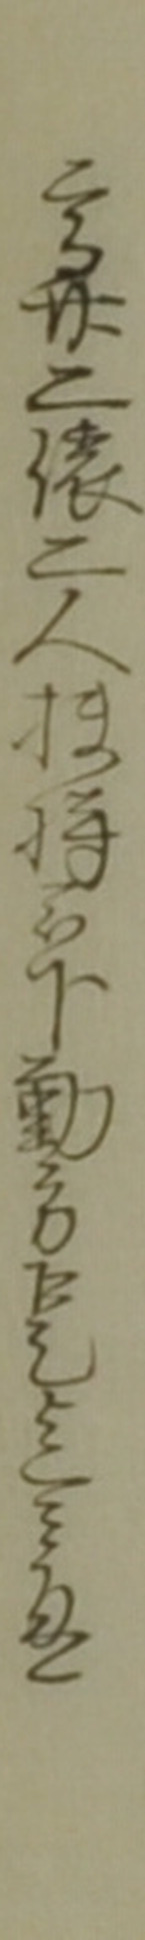高廿二俵二人扶持被下勤方是迄之通
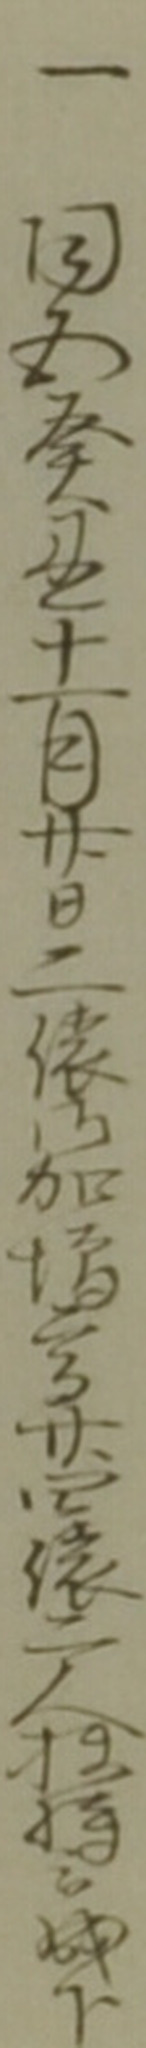一同五癸丑十一月廿日二俵御加増高廿四俵二人扶持被成下
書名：無足廃家（弐）
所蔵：伊那市立高遠町図書館・合同会社AMANE
